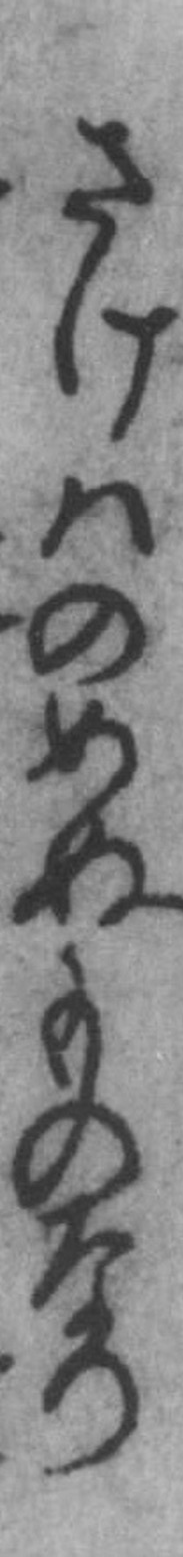さけハのめぬものなりと
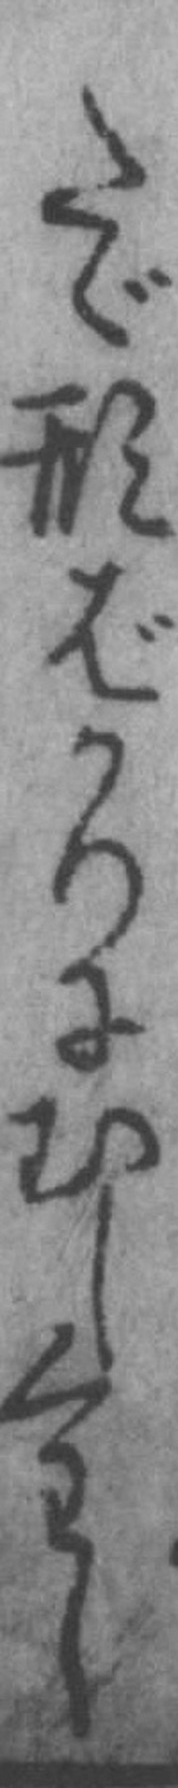たゞ形ばかりにむしくわし
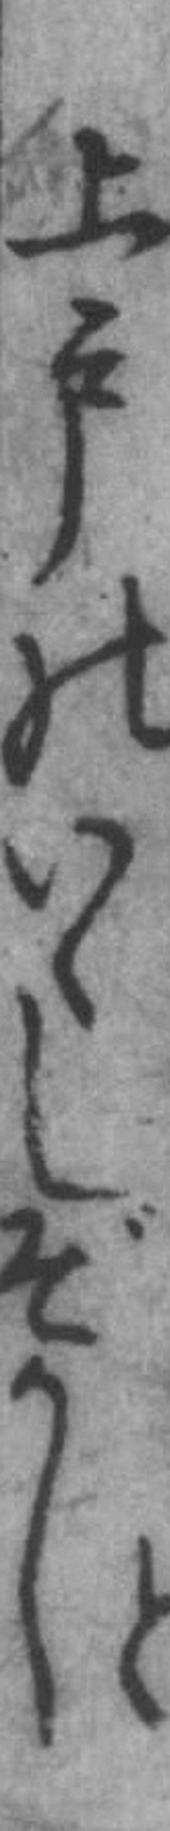上戸のいゝしぞかし
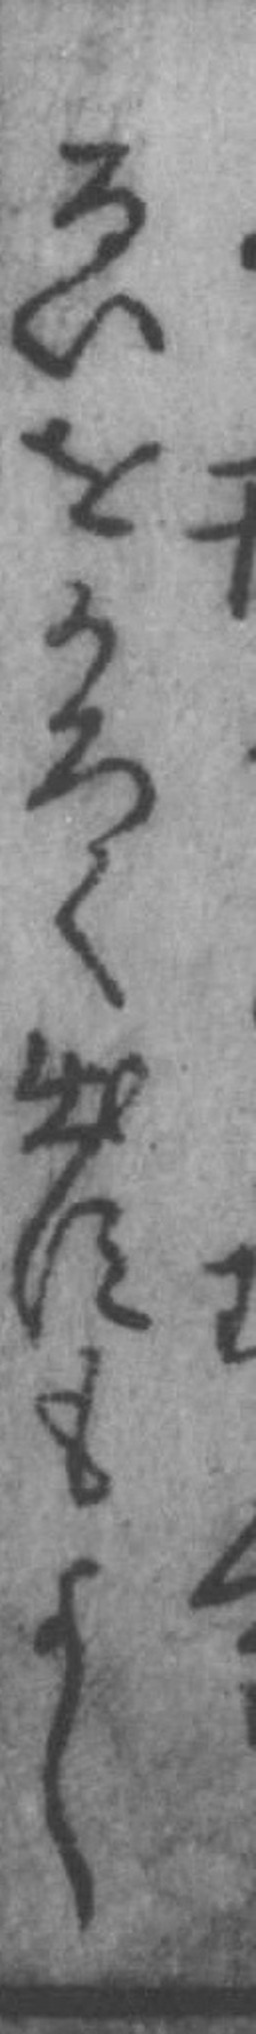るいをかろく出すもよし
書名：料理献立抄
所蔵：大阪府立大学学術情報センター 国文学研究資料館
